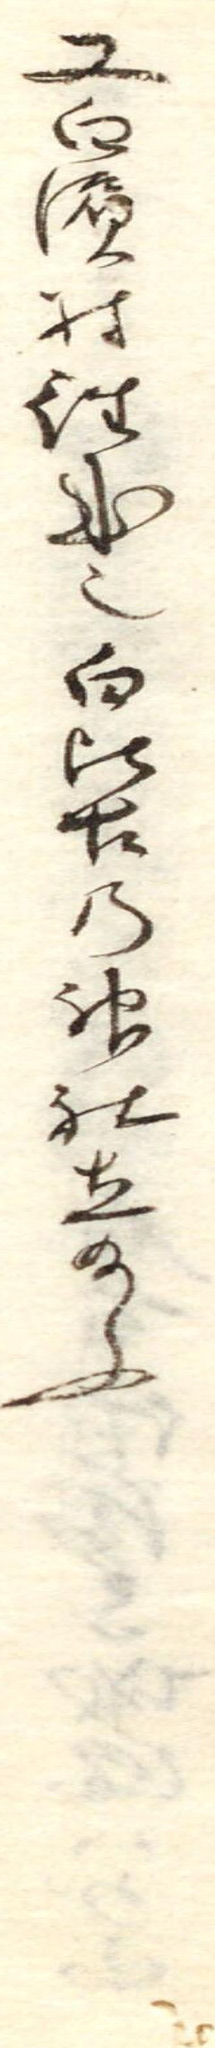又白浜村往来也白比古の神社立給ふ
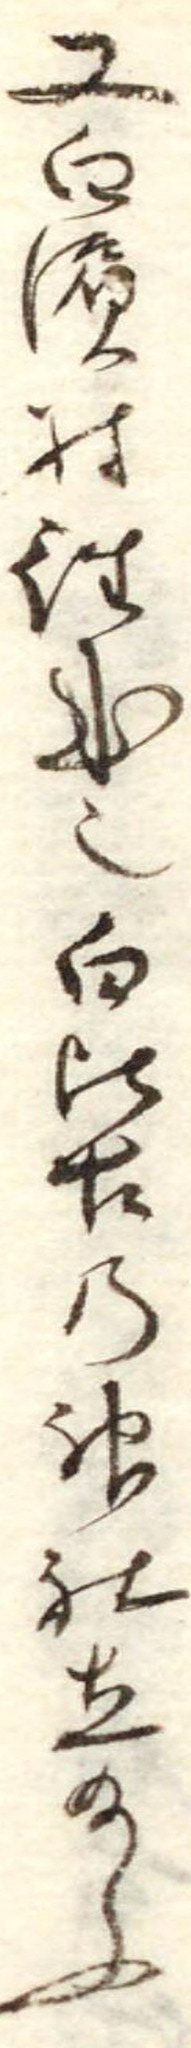又白浜村往来也白比古の神社立給ふ
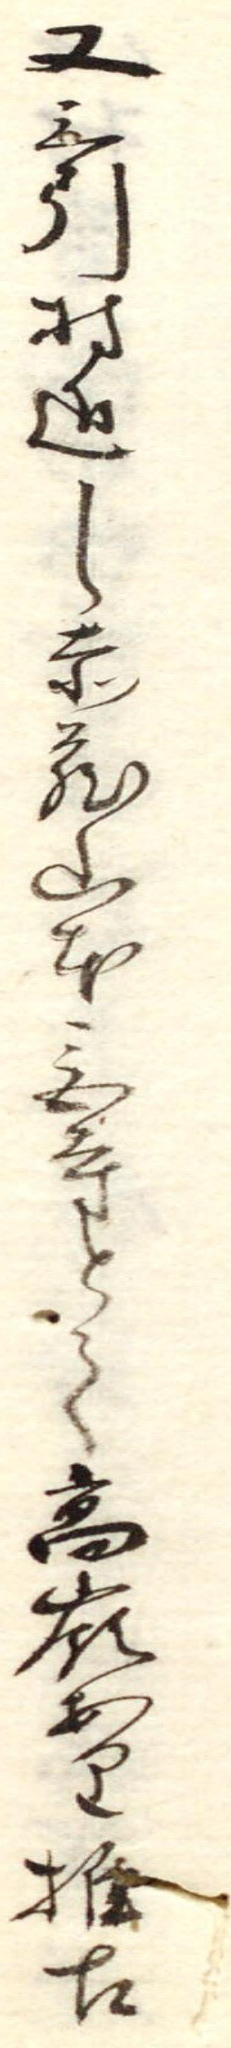又三引村近し赤蔵山本宮寺とて高嶺あり推古
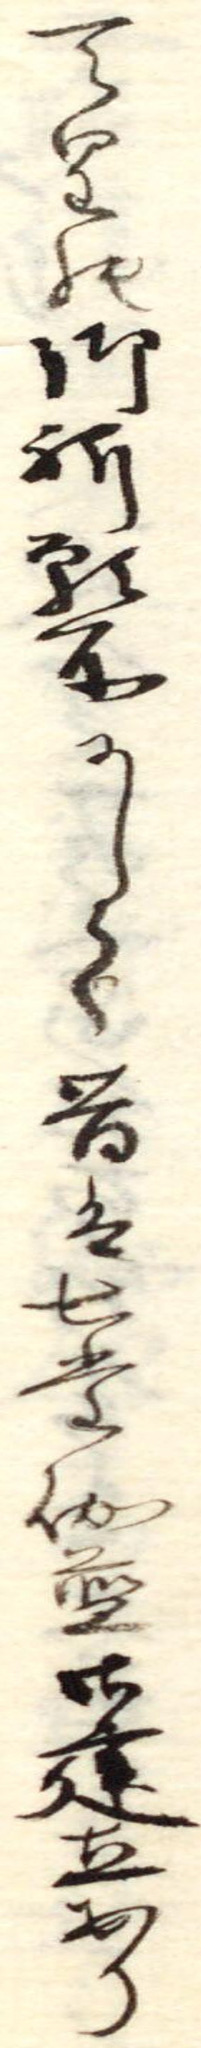天皇の御祈願所にて昔は七堂伽藍御建立あり
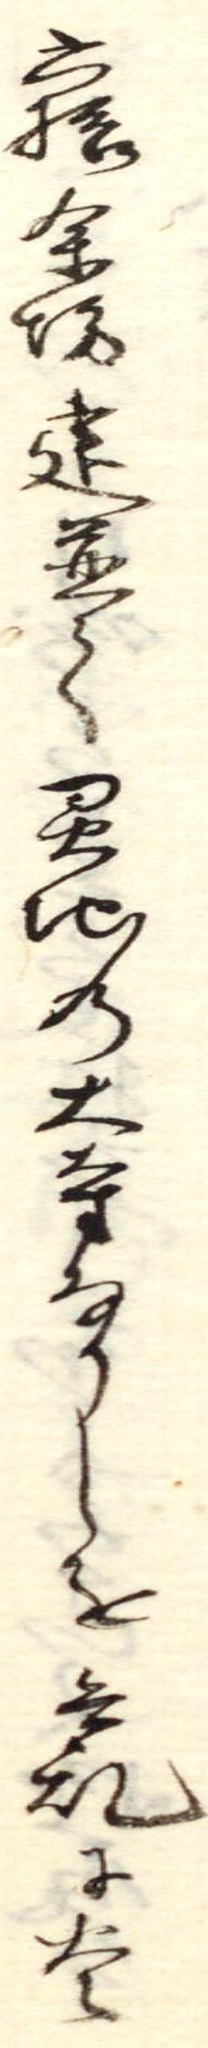六拾余坊建並て霊地の大寺なりしを兵乱に炎
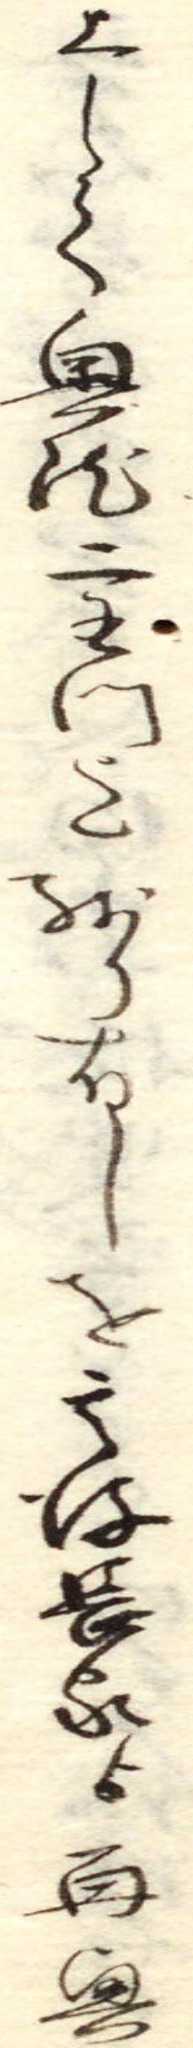上して奥院二王門迄残り有しを其後長家ゟ再興
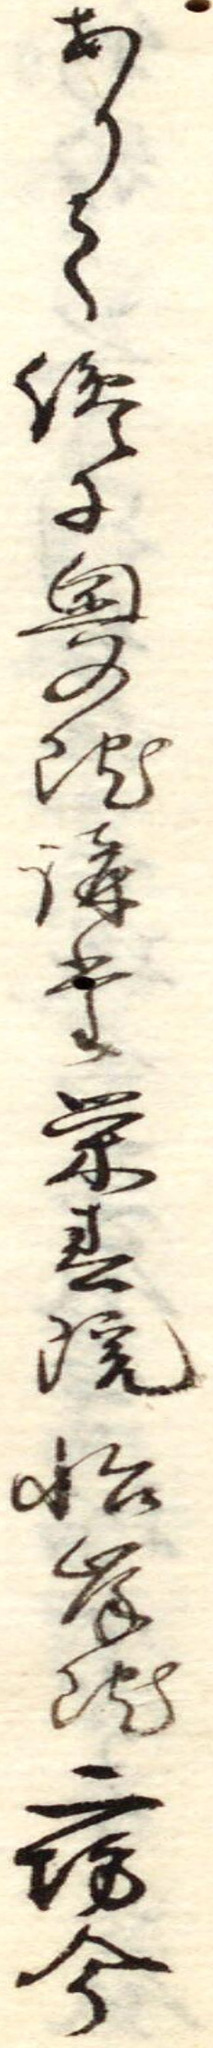ありて纔に奥の院講堂栄春院怡岸院二坊今
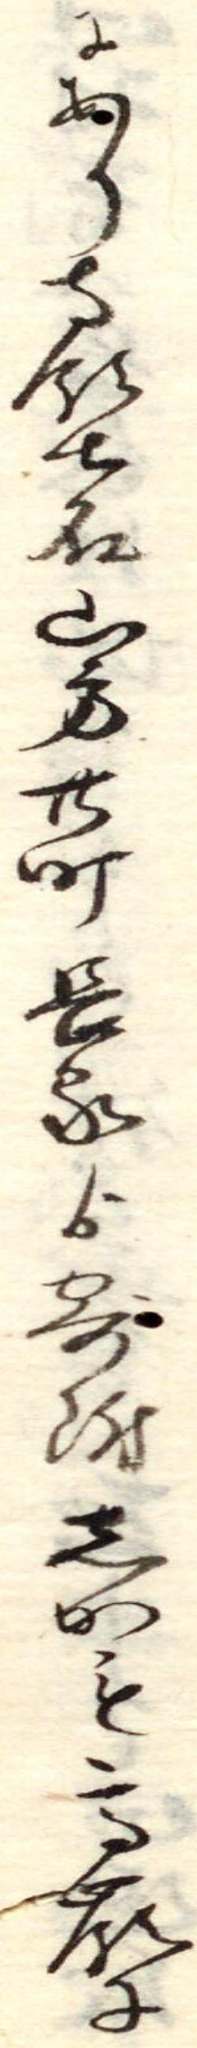にあり寺領七名山方廿町長家ゟ寄附しかも高嶺に
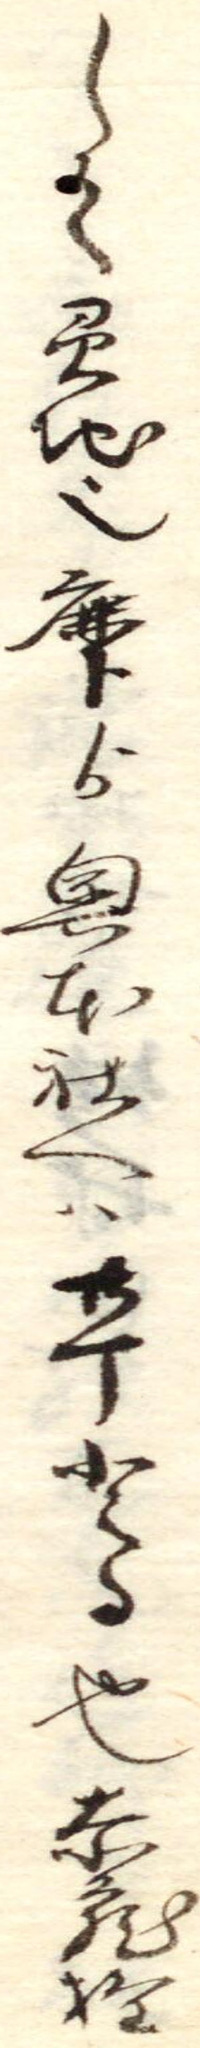して霊地也鹿卜奥本社へは廿丁登る也赤蔵権
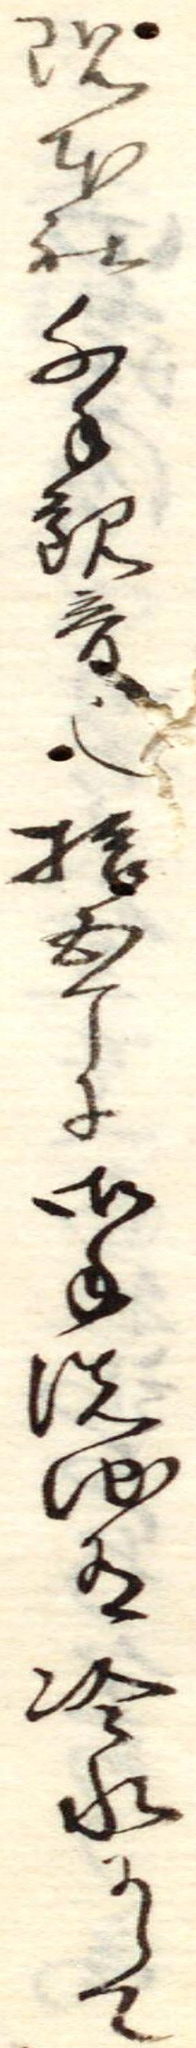現本社千手観音也拾五丁に御手洗池有冷水にて
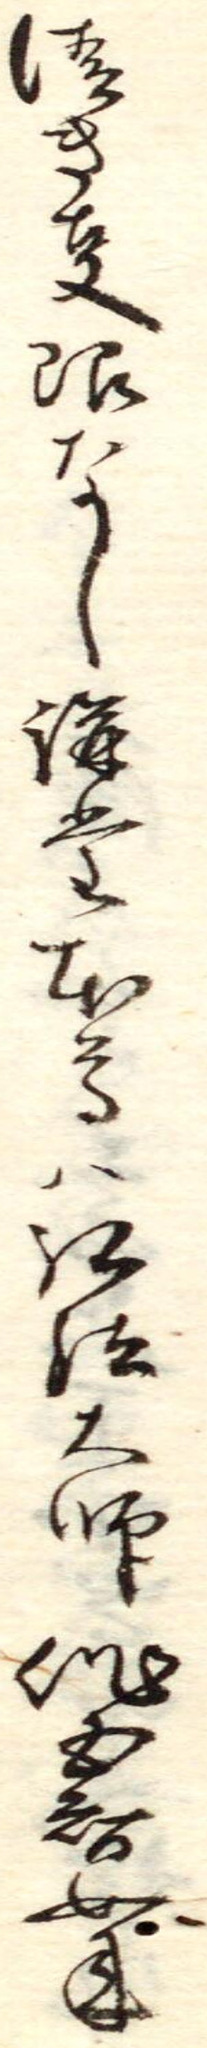清き事限なし講堂本尊は弘法大師作五智如来
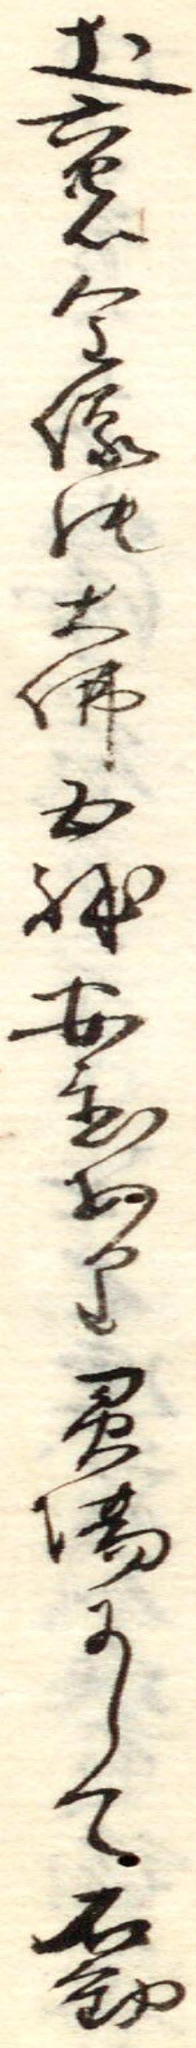丈六の金像の大仏五躰安置あり霊場にして石動
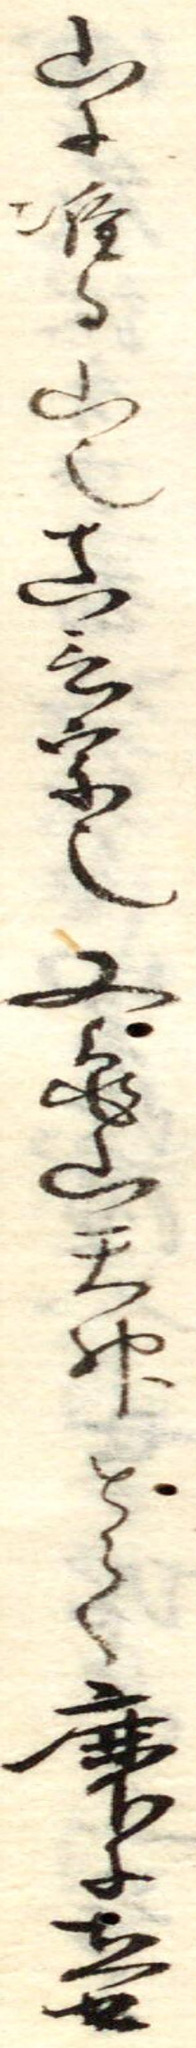山に準る山也真言宗也又亀山天神とて鹿卜に立せ
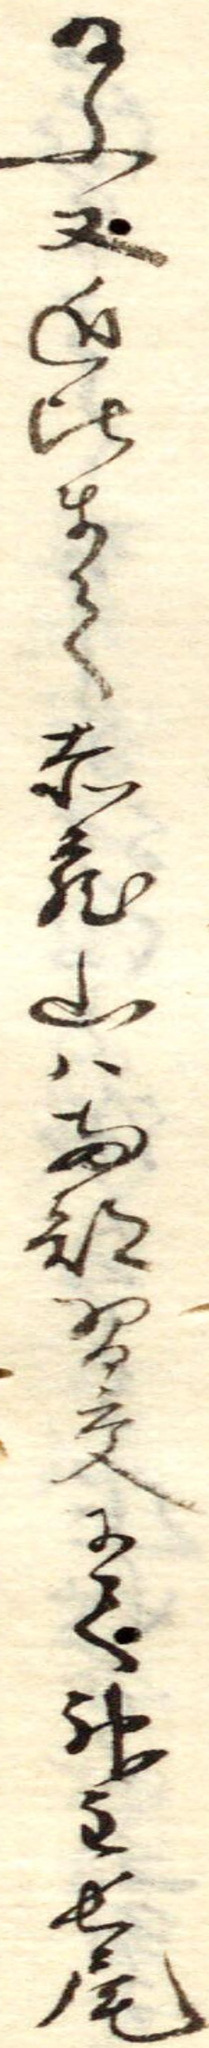給ふまた又近比まて赤蔵山は両部習交にて神主長尾

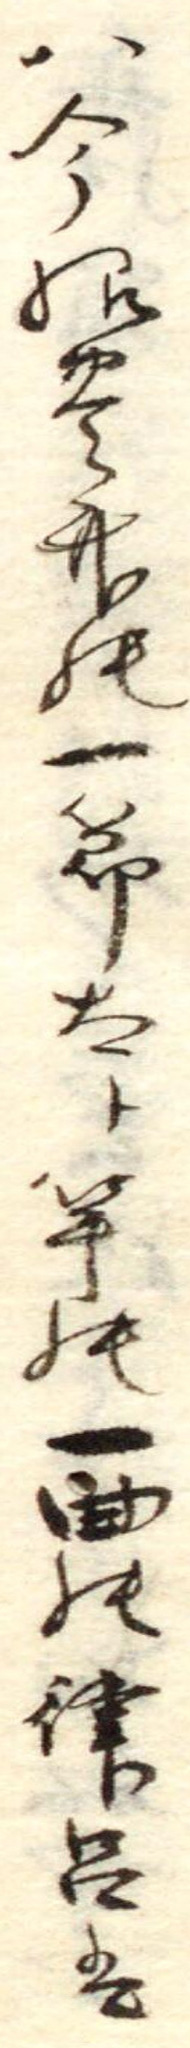は今様豊廿の一節太ト竿の一曲の律呂は
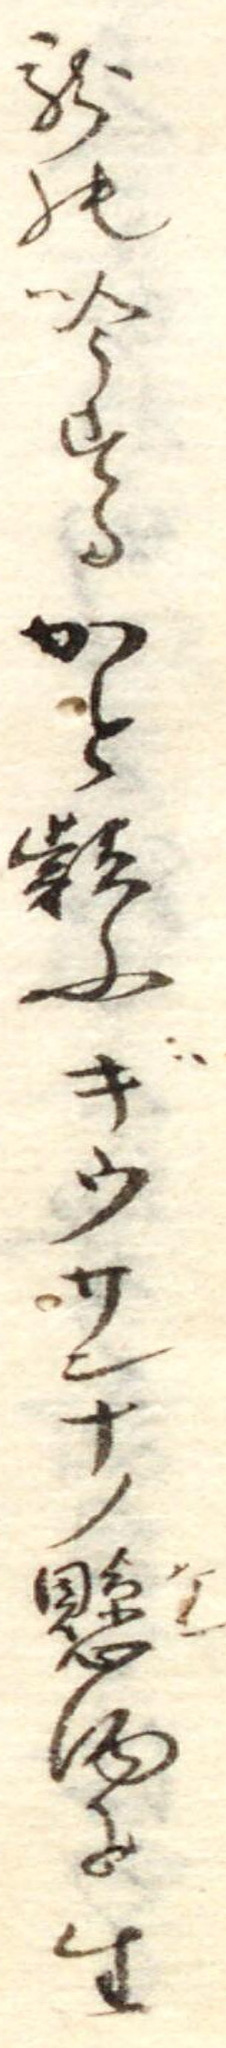龍の吟するかと疑ふキウサンナノ懸酒に生
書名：能登名跡誌
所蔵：Ishikawa Prefectural Library
